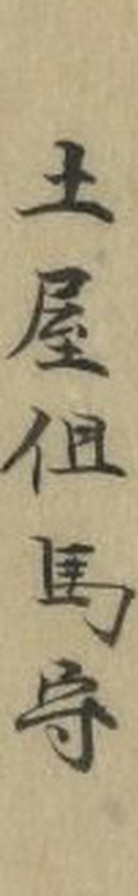土屋但馬守
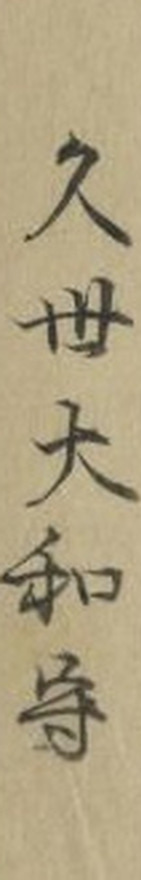久世大和守

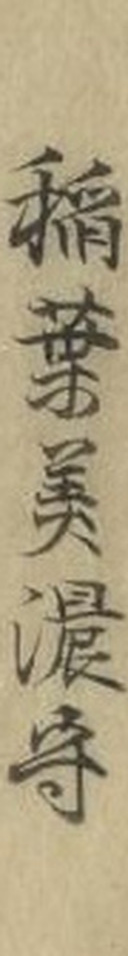稲葉美濃守
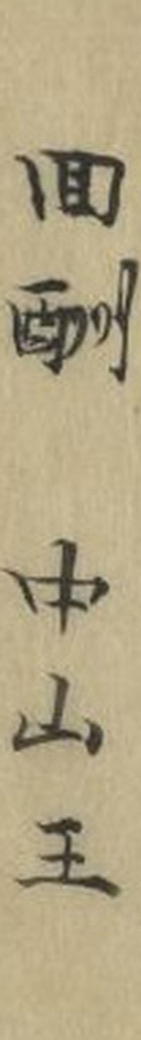回酬中山王
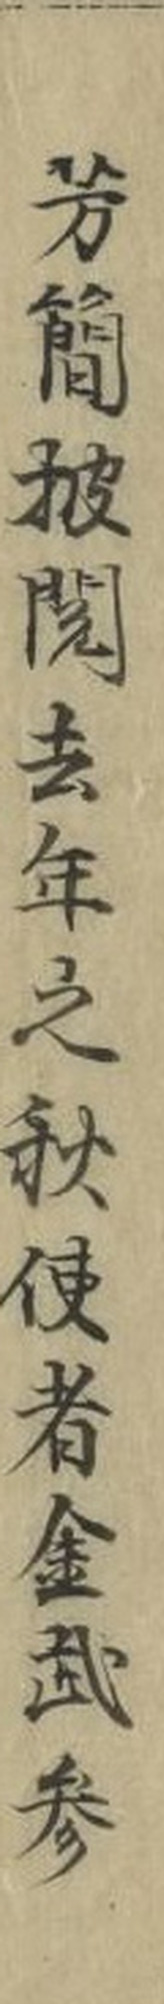芳簡被閲去年之秋使者金武参
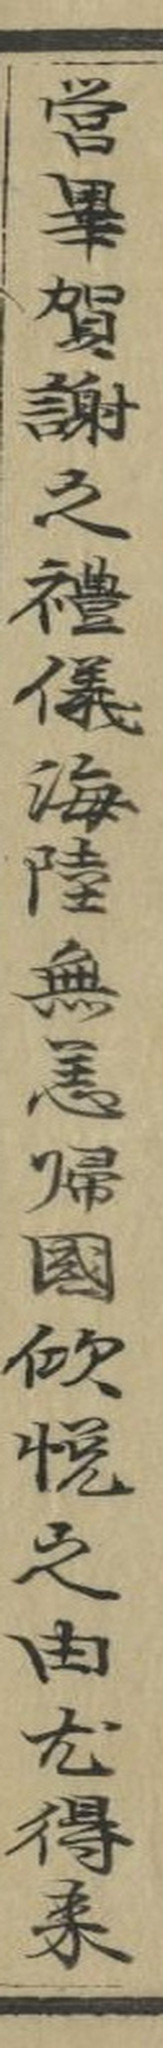営畢賀謝之礼儀海陸無恙帰国傾悦之由尤得来
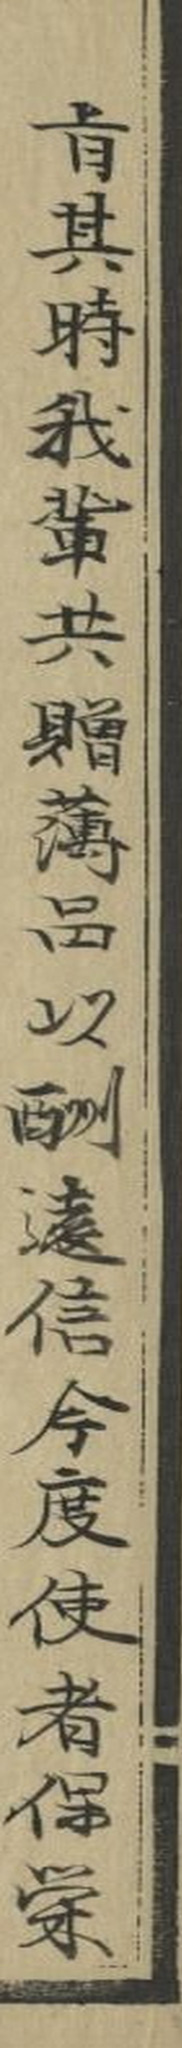旨其時我輩共贈薄品以酬遠信今度使者保栄
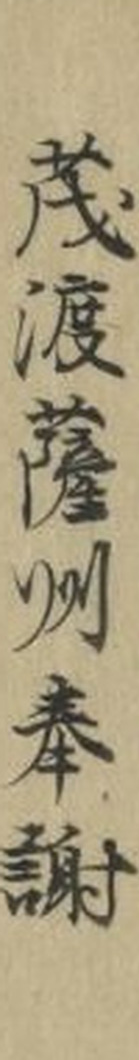茂渡薩州奉謝
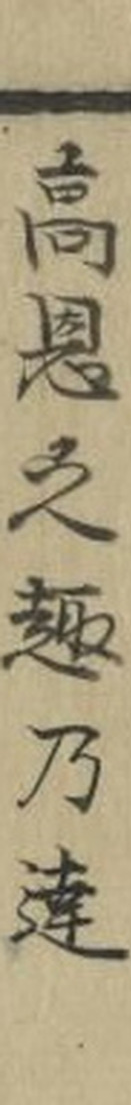高恩之趣乃達
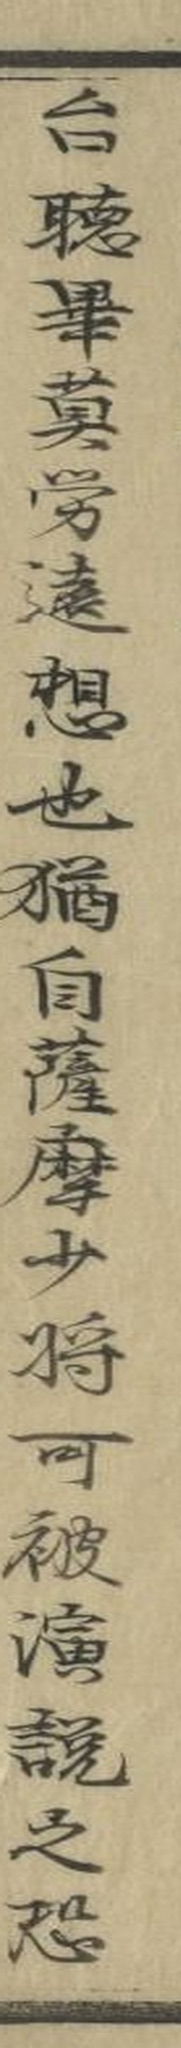台聴畢莫労遠想也猶自薩摩少将可被演説之恐
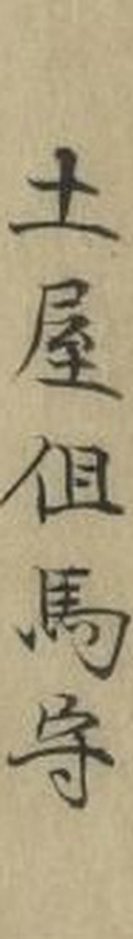土屋但馬守

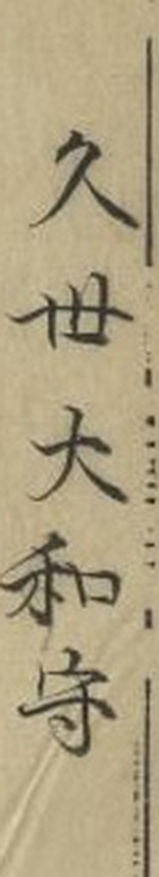久世大和守
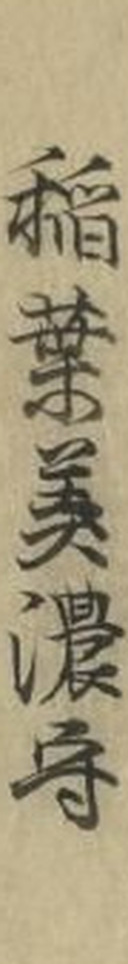稲葉美濃守
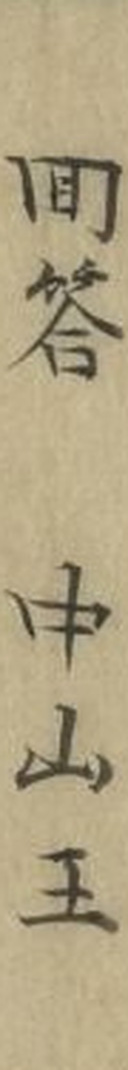回答中山王
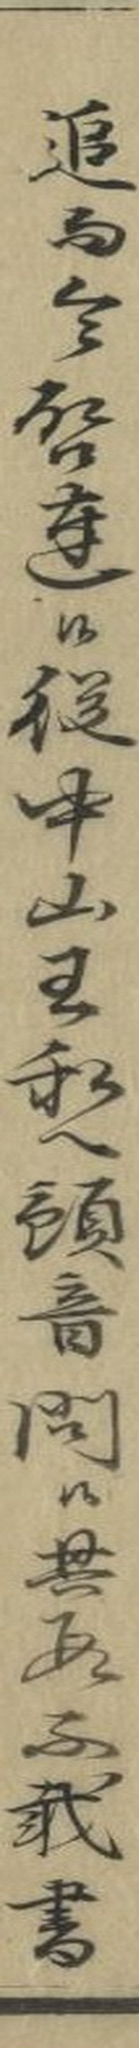追而令啓達候従中山王私へ預音問候其所不載書
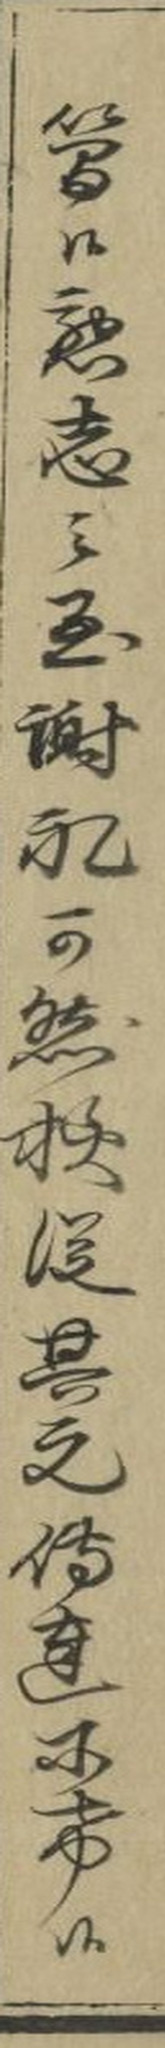簡候懇志之至謝礼可然様従其之伝達等希候
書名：琉球往来（下）
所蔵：University of the Ryukyus Library
